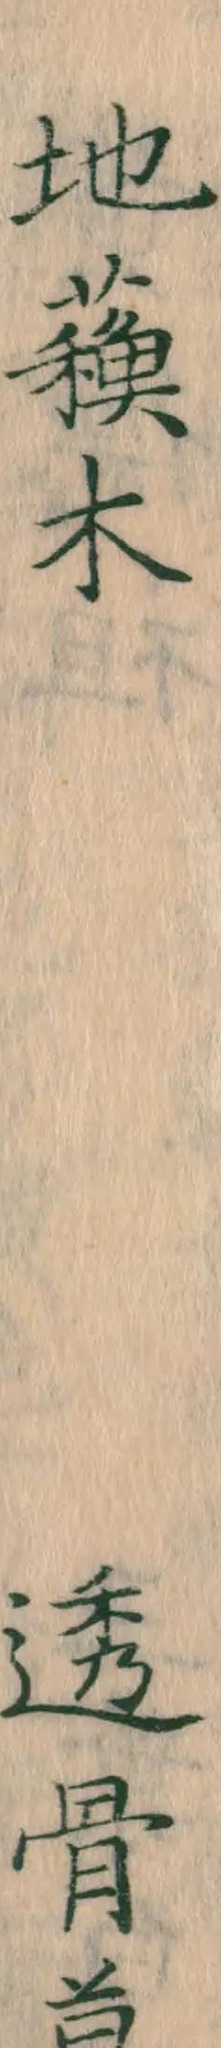地蘇木透骨草
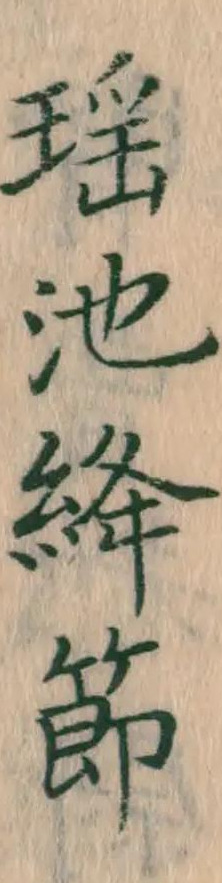瑶池絳節

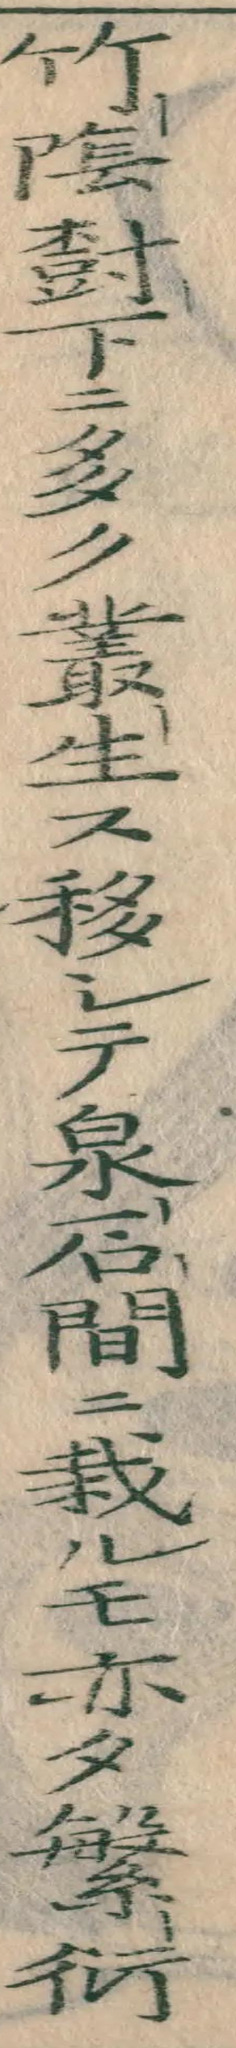竹-陰樹-下ニ多ク叢-生ス移シテ泉-石-間ニ栽ルモ亦タ繁-衍
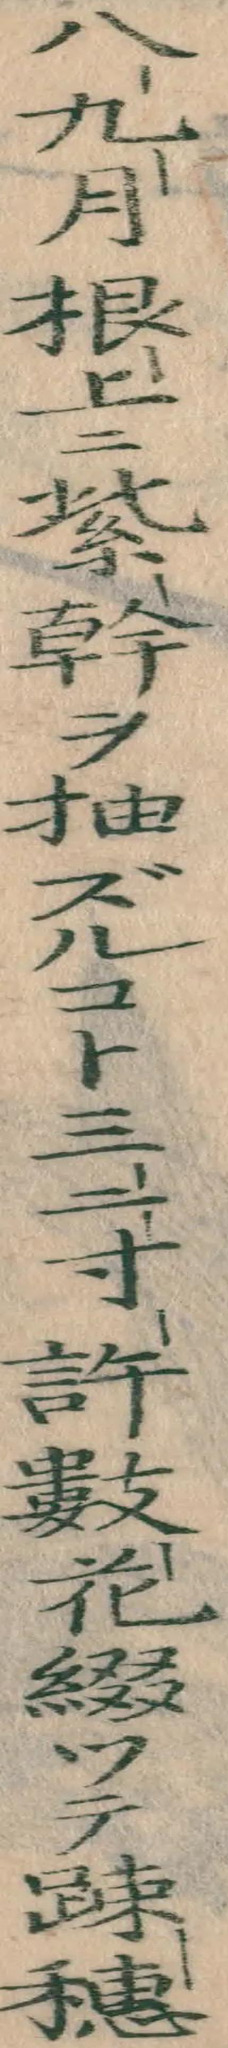八-九-月根-上ニ紫-幹ヲ抽ズルコト三-二-寸-許数-花綴ツテ疏-穂
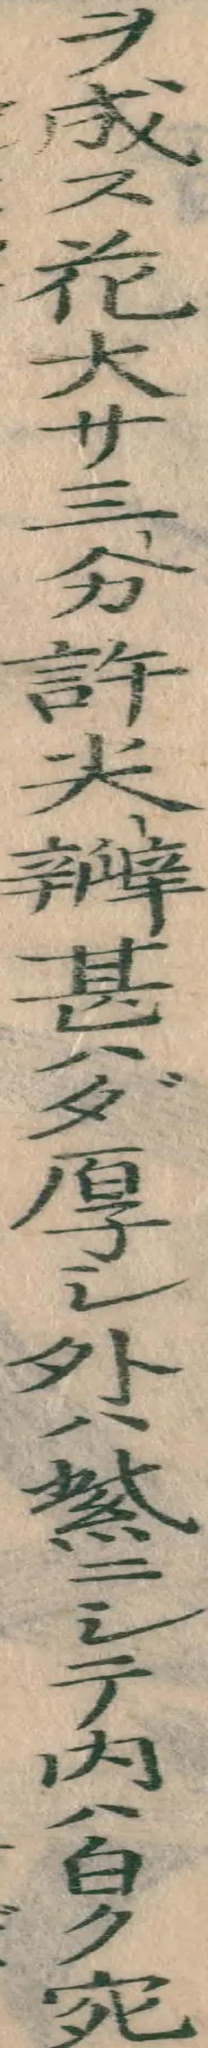ヲ成ス花大サ三-分許尖-弁甚ハダ厚シ外ハ紫ニシテ内ハ白ク宛
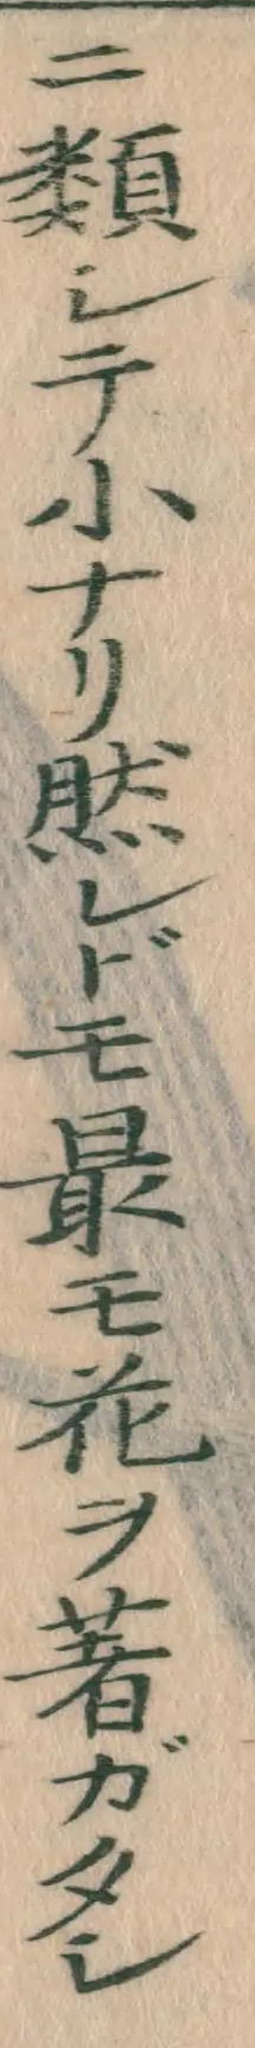ニ類シテ小ナリ然レドモ最モ花ヲ著ガタシ

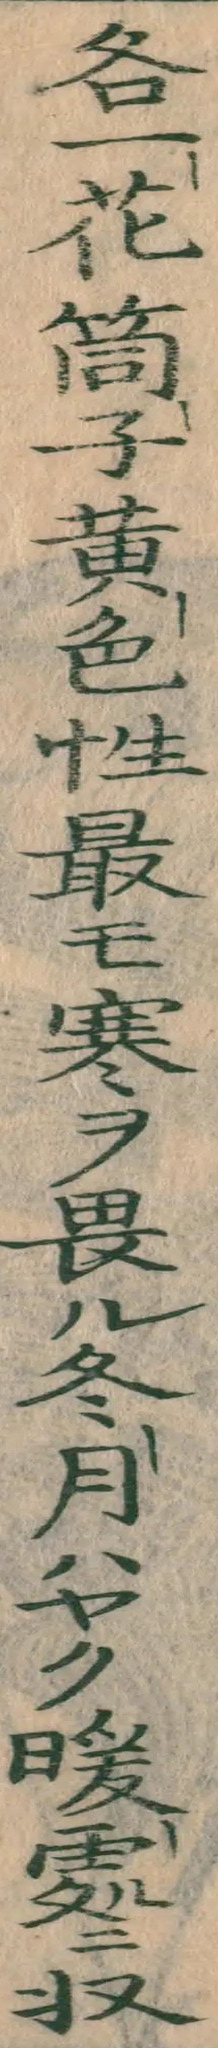各一-花筒-子黄-色性最モ寒ヲ畏ル冬-月ハヤク暖-処ニ収
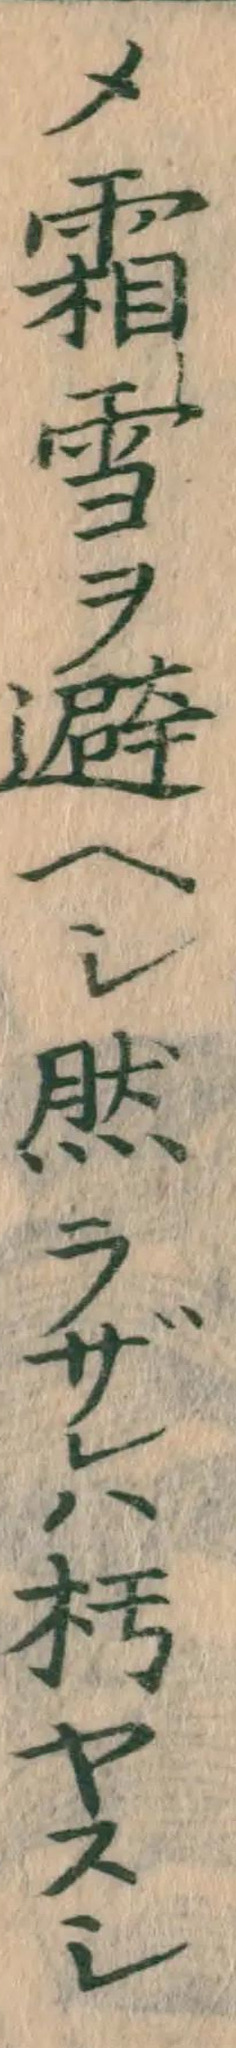メ霜-雪ヲ避ヘシ然ラザレハ朽ヤスシ
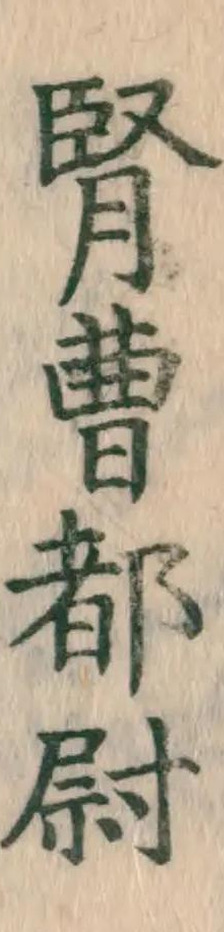腎曹都尉

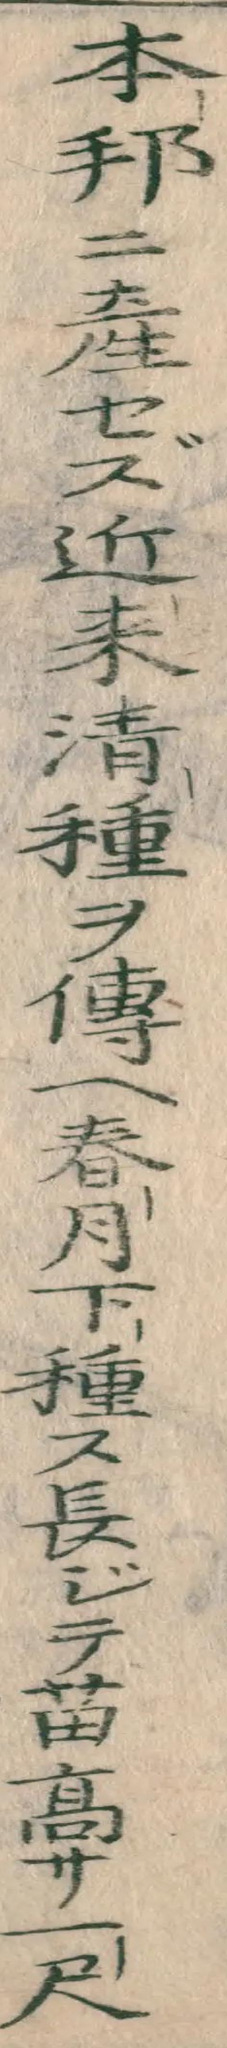本-邦ニ産セズ近-来清-種ヲ伝ヘ春-月下-種ス長ジテ苗高サ一-尺
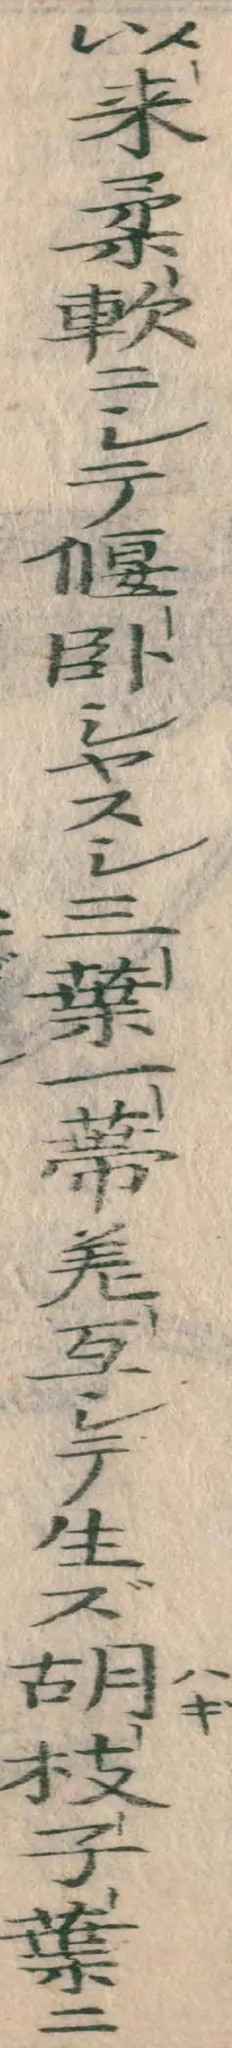以-来柔-軟ニシテ偃-臥シヤスシ三-葉一-蒂差-互シテ生ズ胡-枝-子ハギ-葉ニ
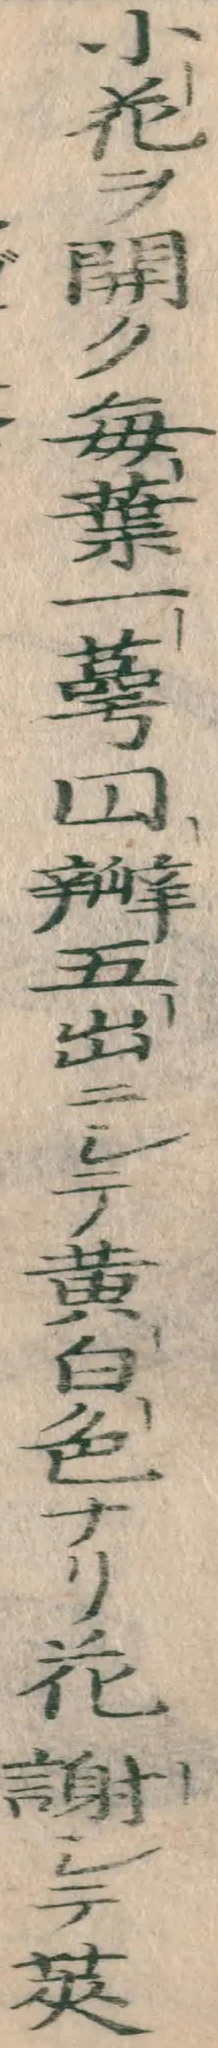小-花ヲ開ク毎-葉一-萼円-弁五-出ニシテ黄-白-色ナリ花謝シテ莢
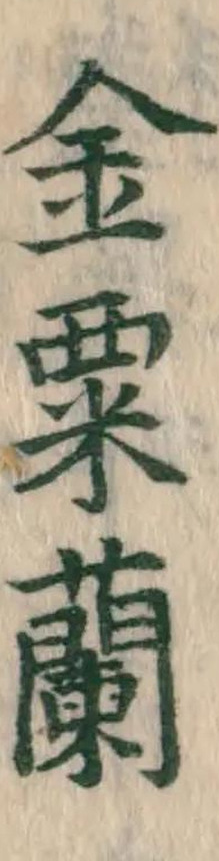金粟蘭

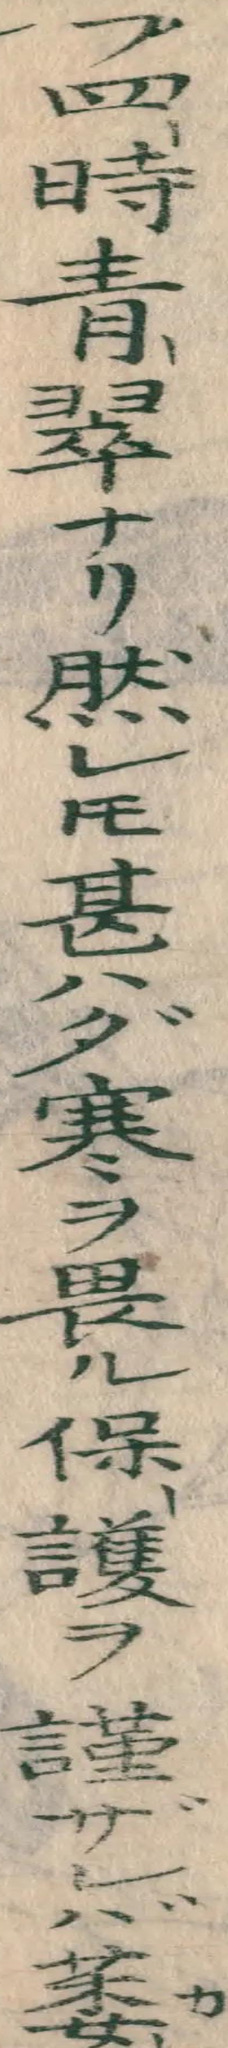フ四-時青-翠ナリ然レトモ甚ハダ寒ヲ畏ル保-護ヲ謹ザレバ萎-
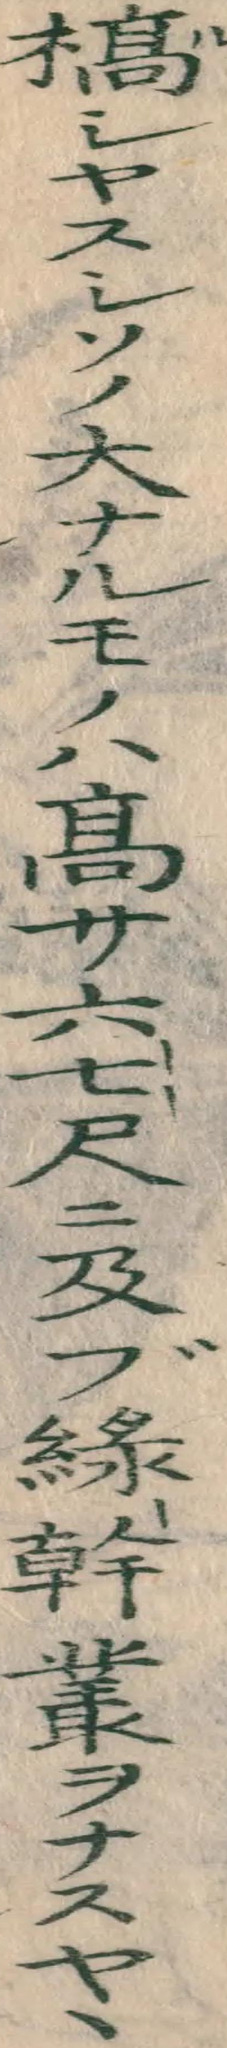槁シヤスシソノ大ナルモノハ高サ六-七-尺ニ及ブ緑-幹叢ヲナスヤヽ
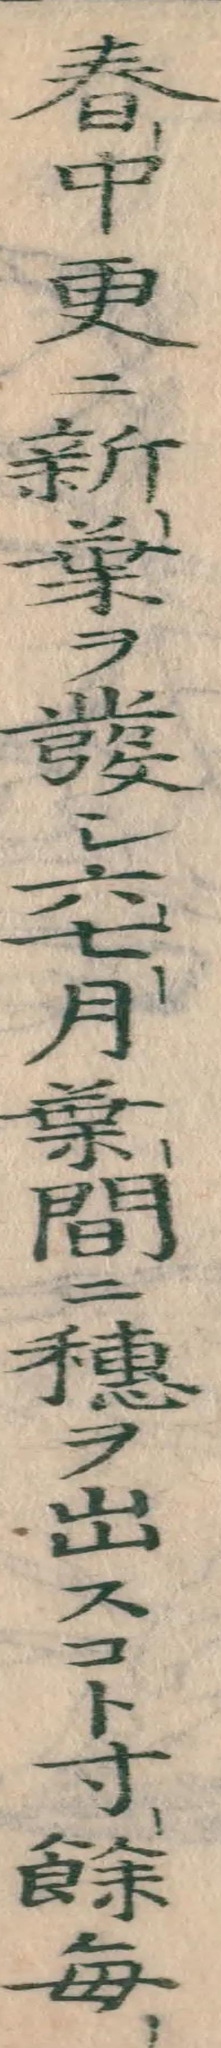春-中更ニ新-葉ヲ発シ六-七-月葉-間ニ穂ヲ出スコト寸-余毎-
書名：花彙 草部4巻木部4巻. [1]
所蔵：国立国会図書館 National Diet Library, JAPAN
